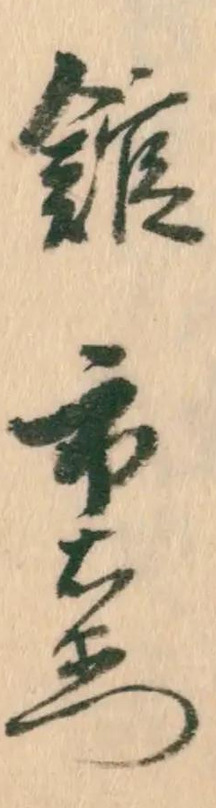館市右衛門
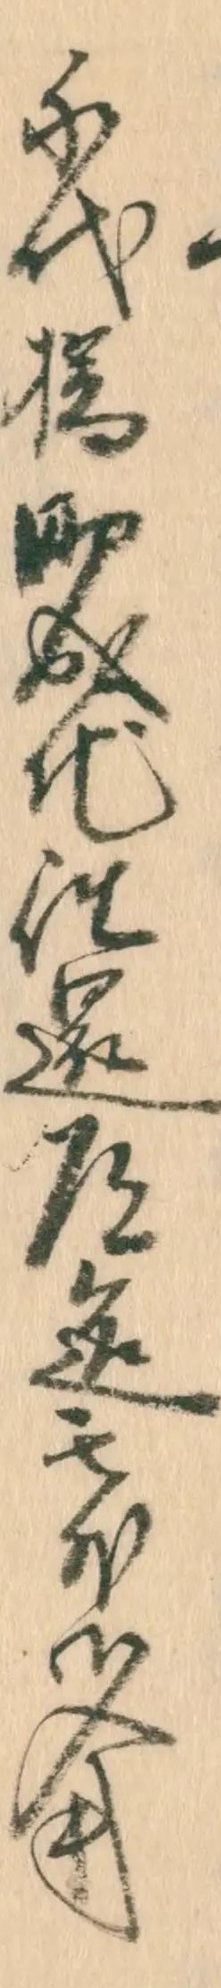永代橋助成地往還道造其外御入用
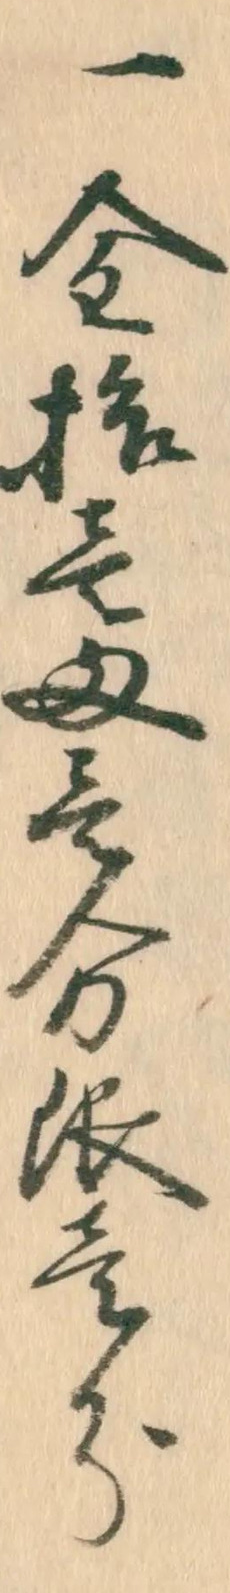一金拾壱両壱分銀壱分

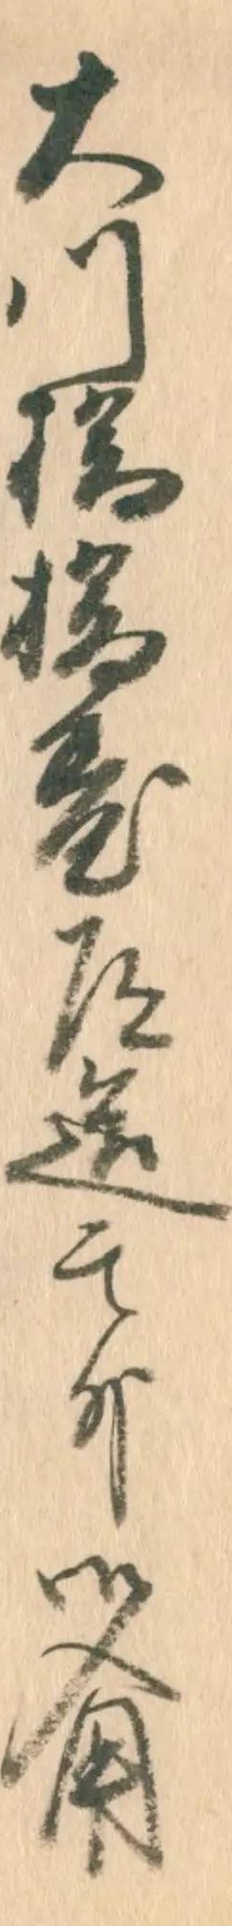大川橋橋台道造其外御入用
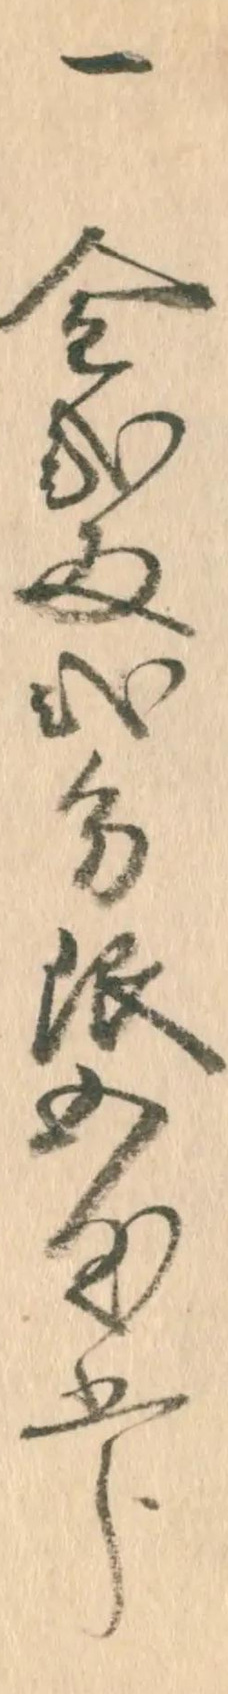一金弐両弐分銀五匁五分
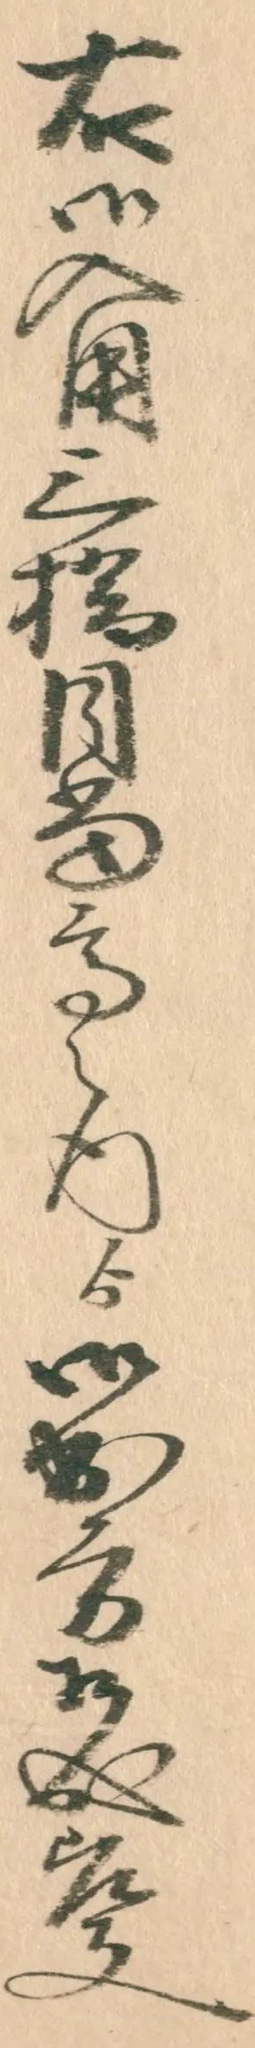右御入用三橋目当高之内ゟ御出方相成差支
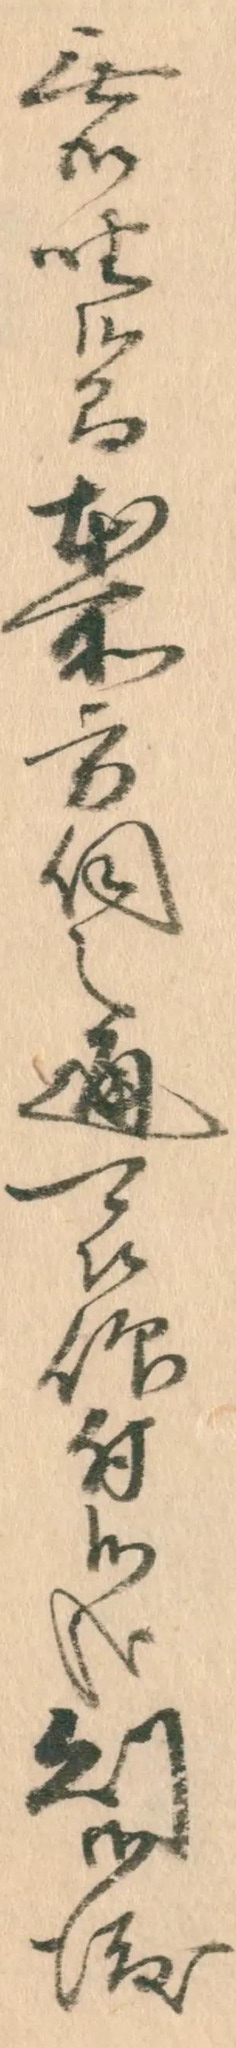無御座候間本所方伺之通可被仰付候哉則御渡
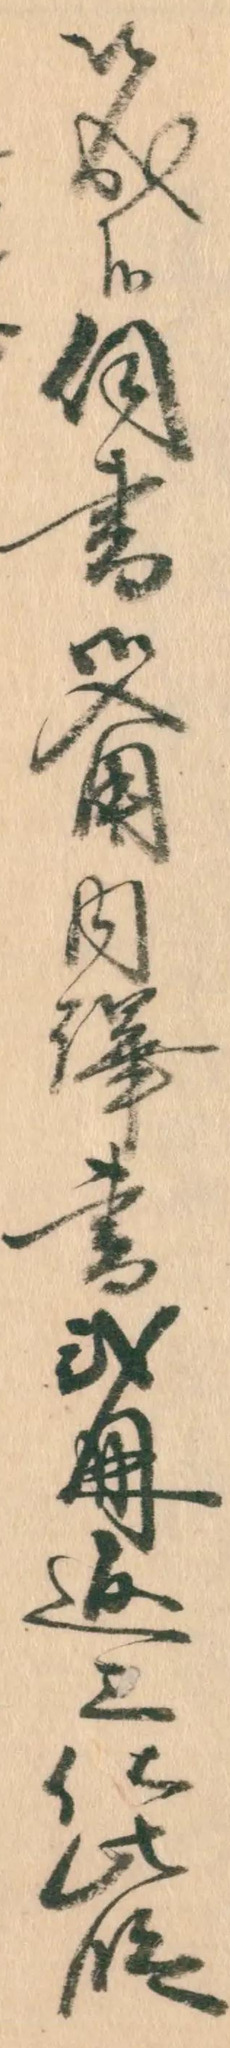被成候伺書御入用内訳書弐冊返上仕此段
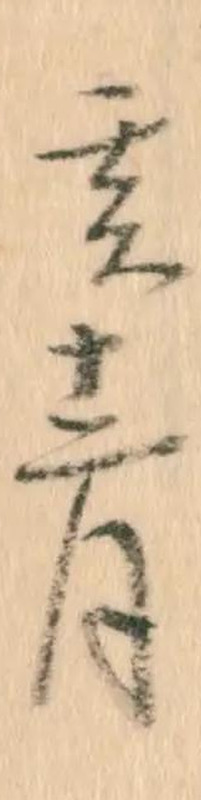亥十二月
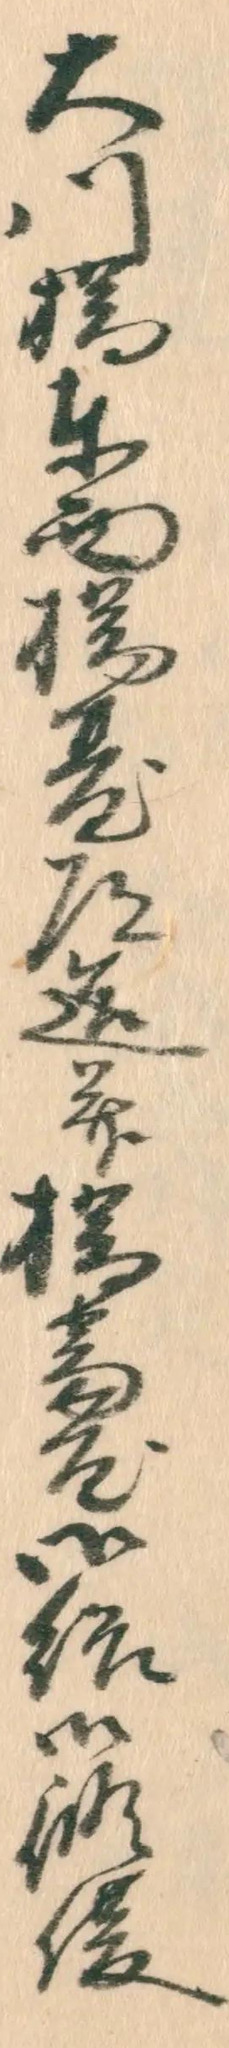大川橋東西橋台道造并橋番屋御繕御修復
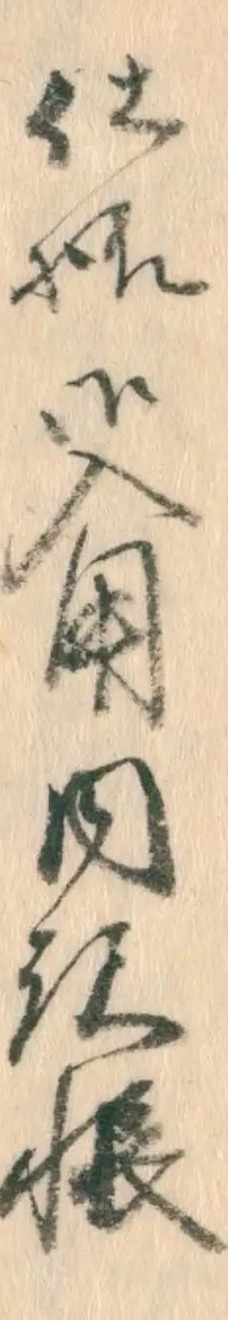仕様御入用内訳帳

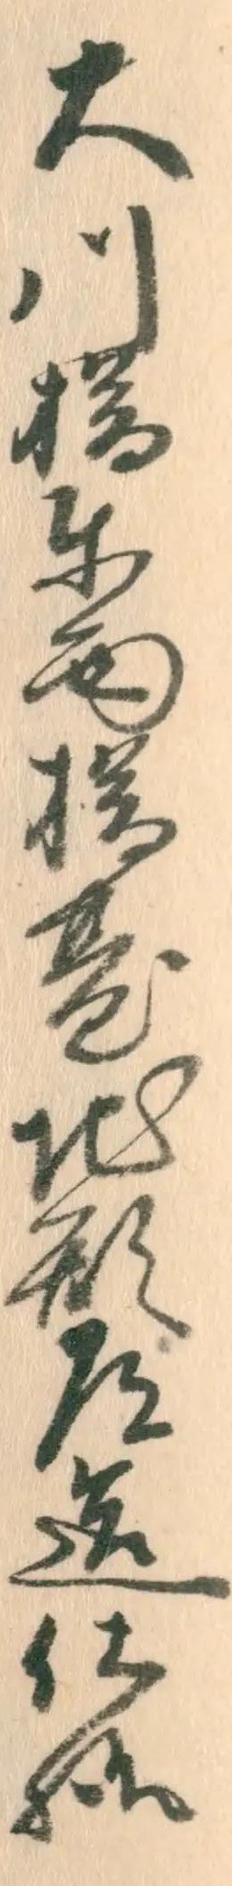大川橋東西橋台地形道造仕様
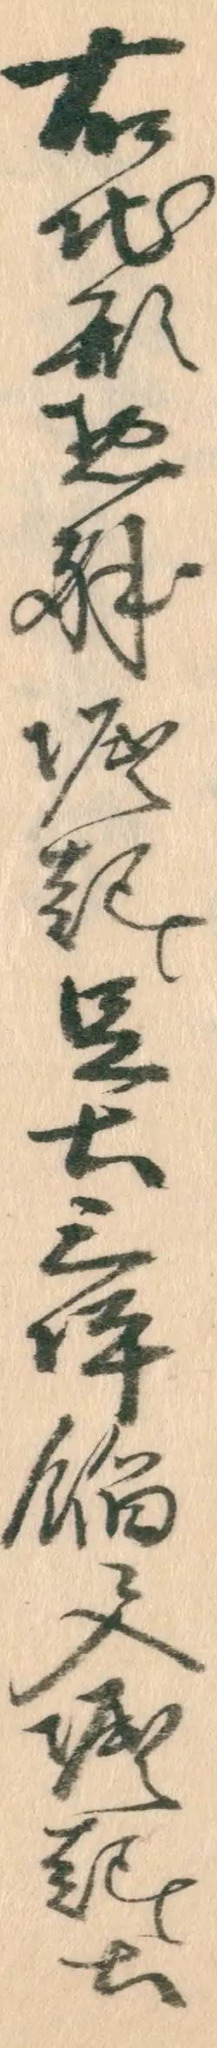右地形惣体堀起し足土三坪餡ニ入掘起土
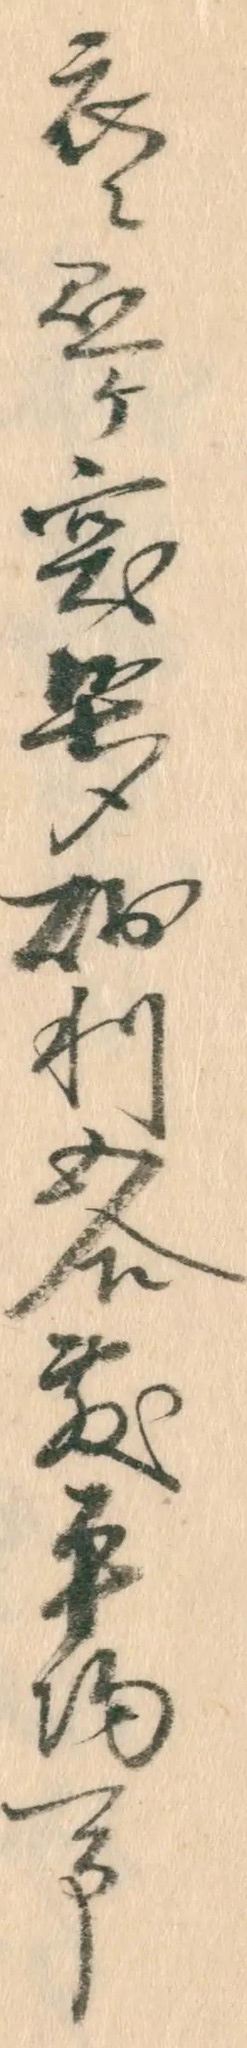衣ニ懸ケ突堅メ砂利五合敷平均可申
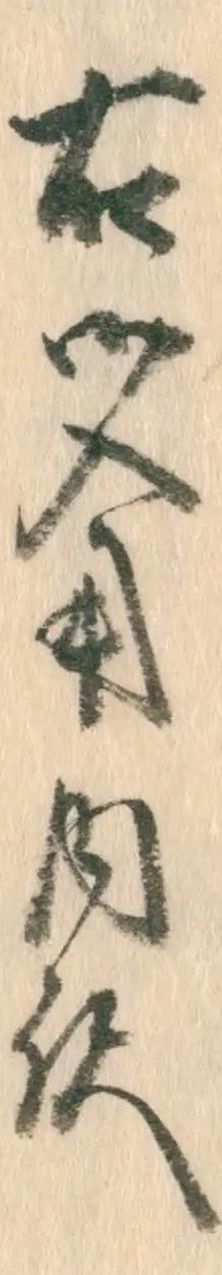右御入用内訳
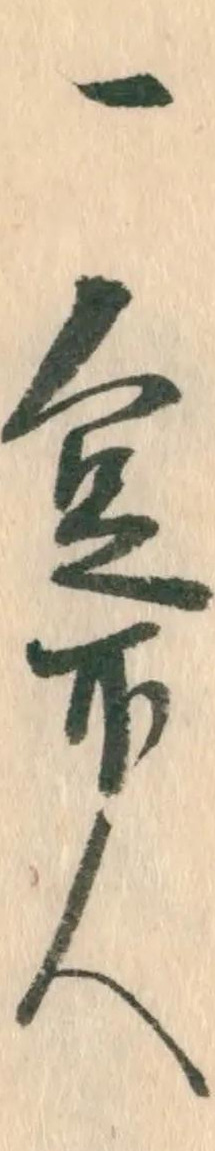一人足廿人
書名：三橋 17巻. [7] 三橋小破御修復書留　但御奉行御掛リ替地震潰橋番屋　嘉永四亥年より安政二卯年迄　上
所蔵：国立国会図書館 National Diet Library, JAPAN
